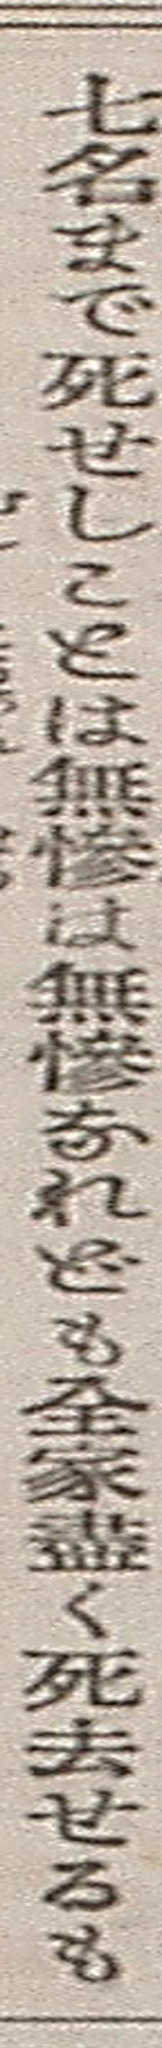七名まで死せしことは無惨は無惨なれども全家尽く死去せるも
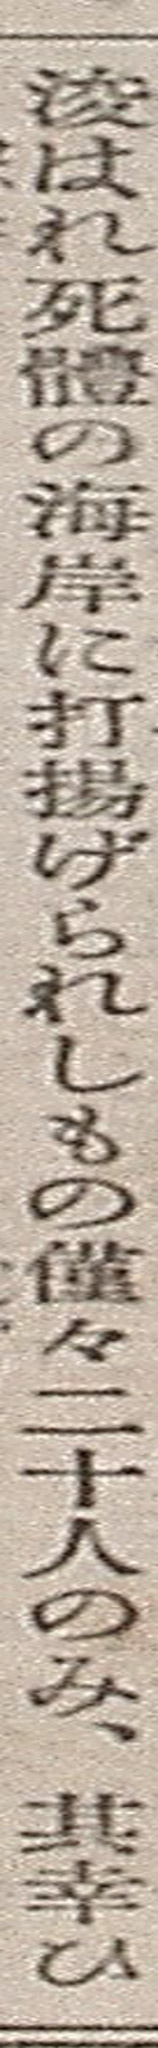浚はれ死体の海岸に打揚げられしもの僅々二十人のみ、其幸ひ
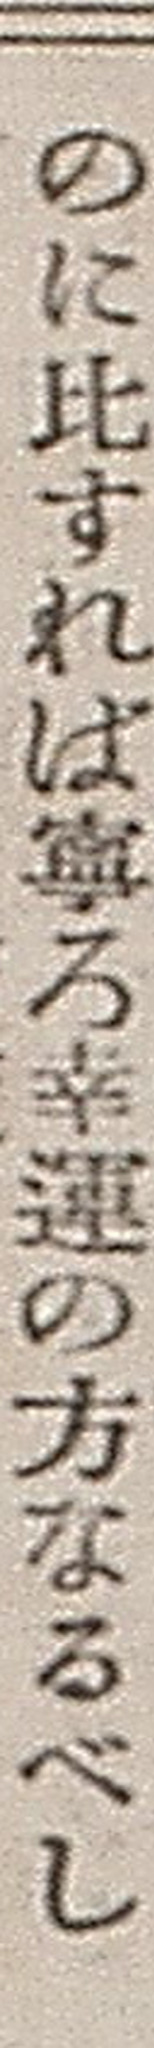のに比すれば寧ろ幸運の方なるべし
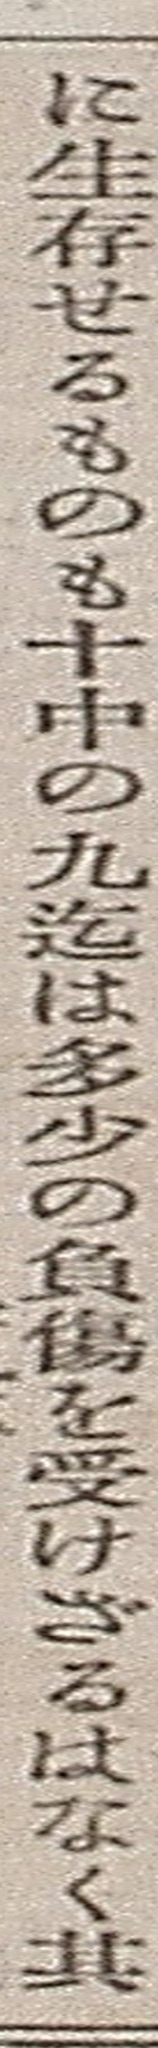に生存せるものも十中の九迄は多少の負傷を受けざるはなく其
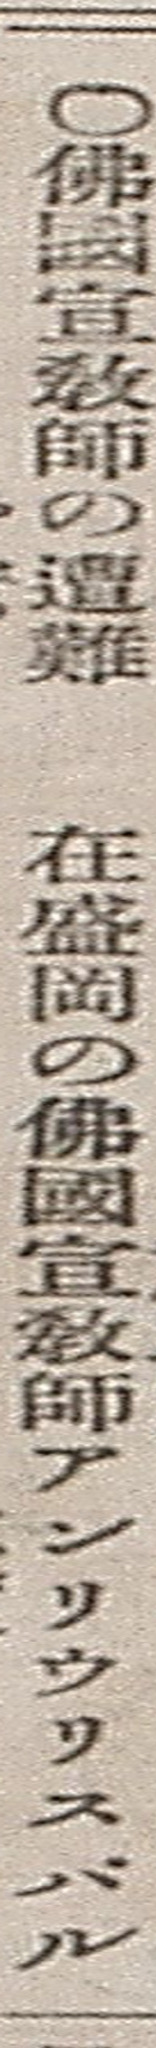○仏国宣教師の遭難在盛岡の仏国宣教師アンリウリスバル
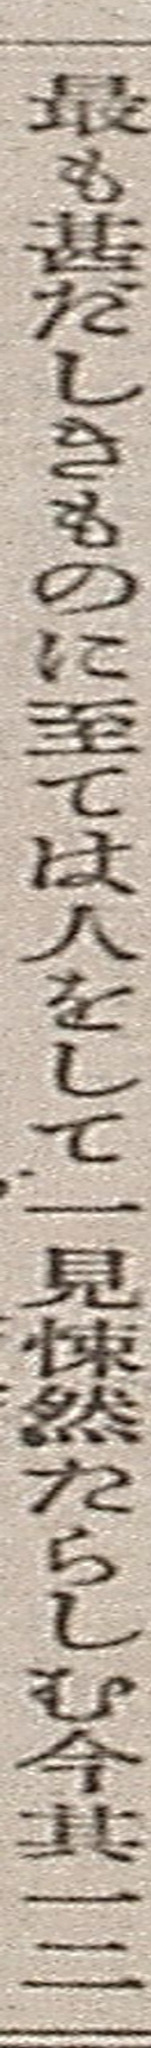最も甚だしきものに至ては人をして一見悚然たらしむ今其一二
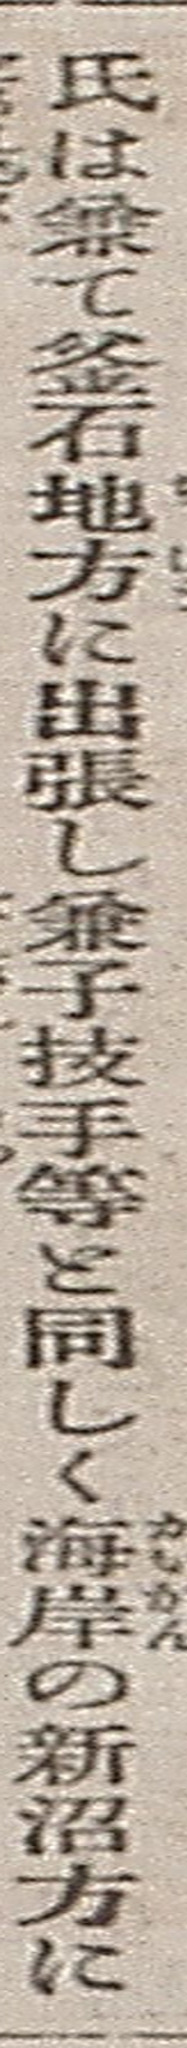氏は兼て釜石地方に出張し兼子技手等と同しく海岸の新沼方に
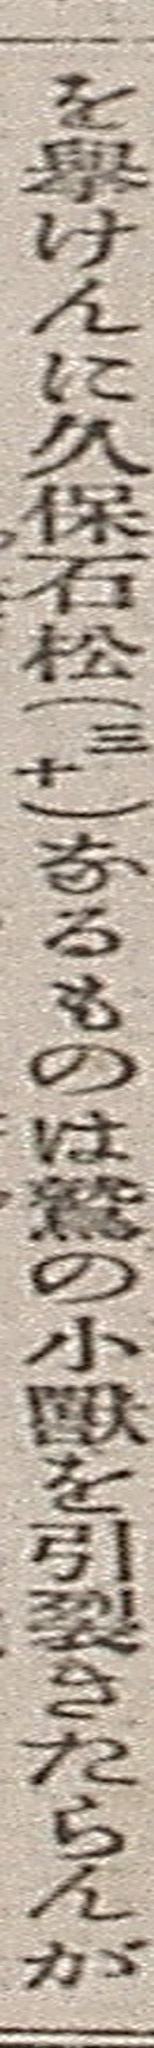を挙けんに久保石松なるものは鷲の小獣を引裂きたらんが
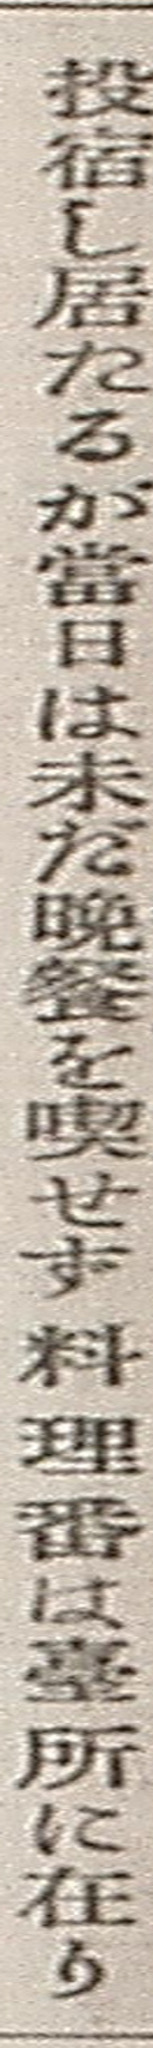投宿し居たるが当日は未だ晩餐を喫せず料理番は台所に在り
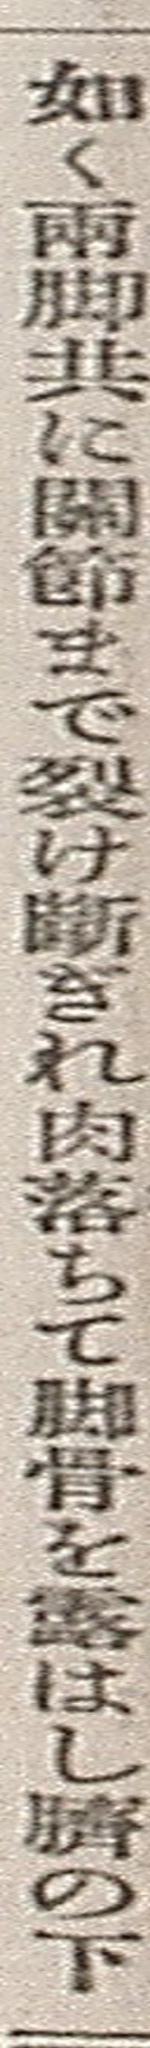如く両脚共に関節まで裂け断ぎれ肉落ちて脚骨を露はし臍の下

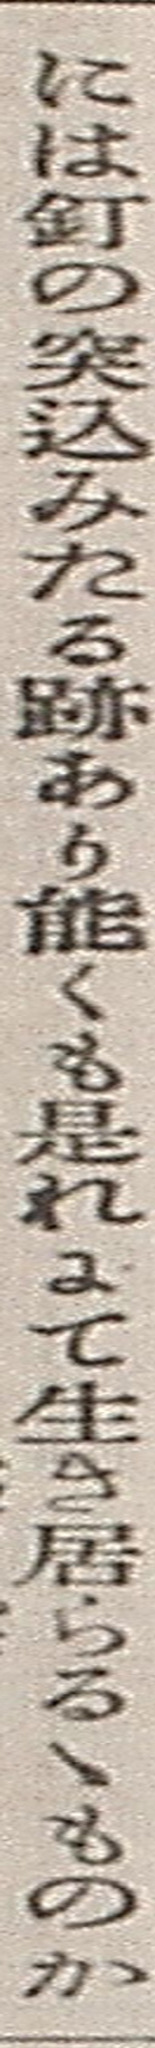には釘の突込みたる跡あり能くも是れにて生き居らるゝものか
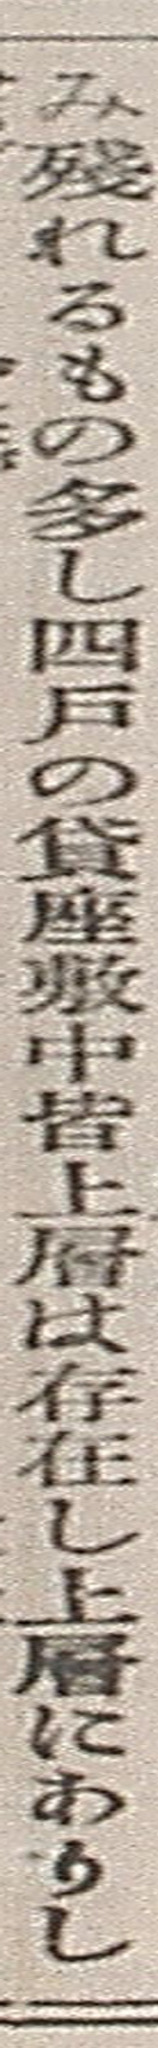み残れるもの多し四戸の貸座敷中皆上層は存在し上層にありし
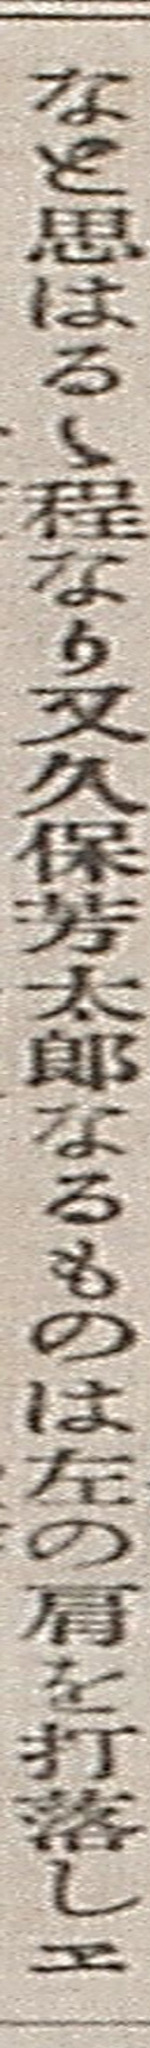なと思はるゝ程なり又久保芳太郎なるものは左の肩を打落しヱ
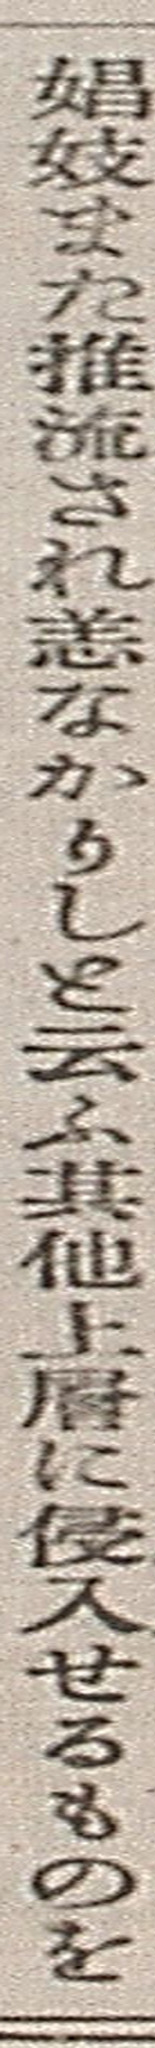娼妓また推流され恙なかりしと云ふ其他上層に侵入せるものを
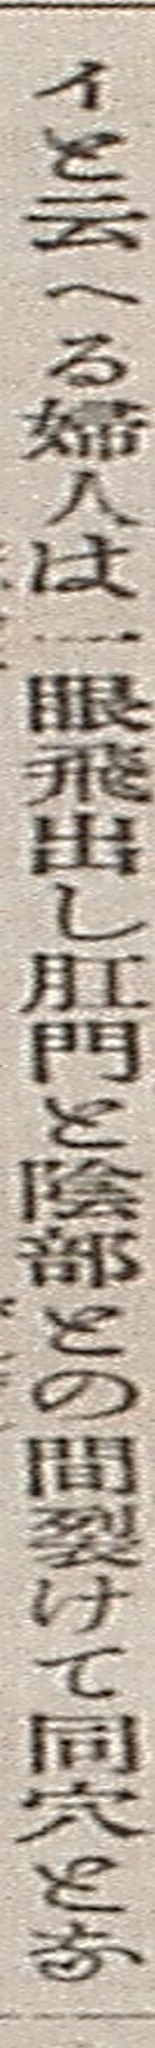イと云へる婦人は一眼飛出し肛門と陰部との間裂けて同穴とな
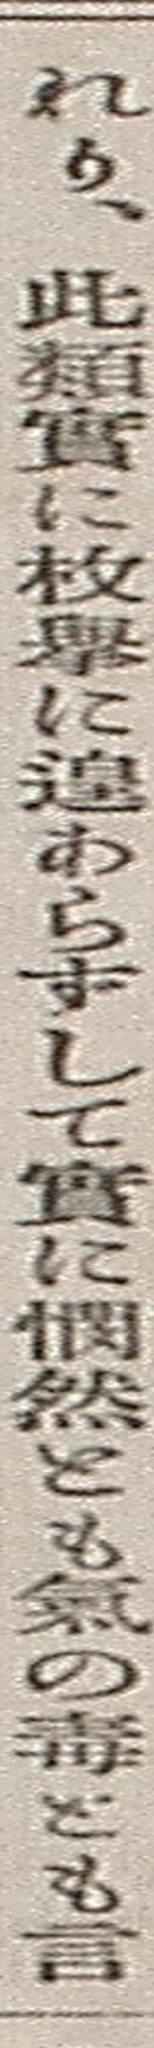れり、此類実に枚挙に遑あらずして実に憫然とも気の毒とも言
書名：風俗畫報臨時増刊第百十九號　大海嘯被害録（中）
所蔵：東京大学地震研究所図書室 Earthquake Research Institute Library, The University of Tokyo, JAPAN
